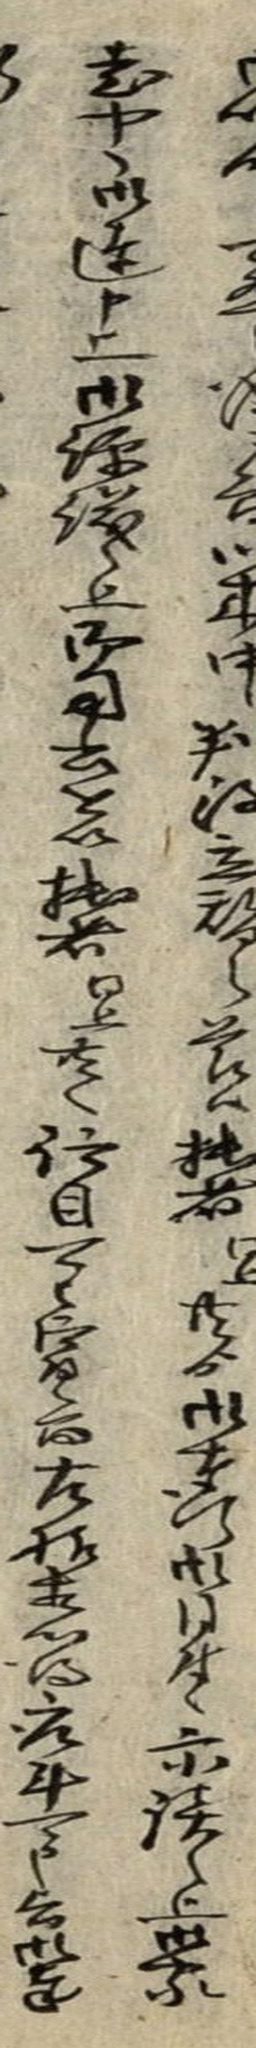老中へ御達申上御評議之上御用書を以拙者同上共へ跡目可被仰付候間左様相心得取斗可申旨御奉
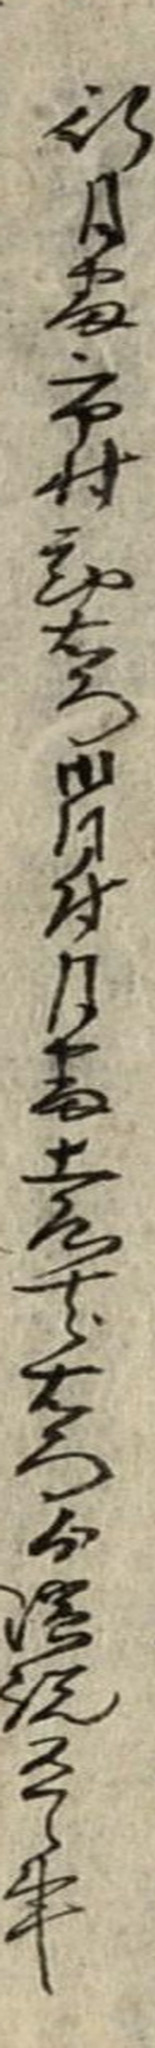行月番市村勘右衛門御目付月番土屋十郎右衛門ゟ演説有之候事
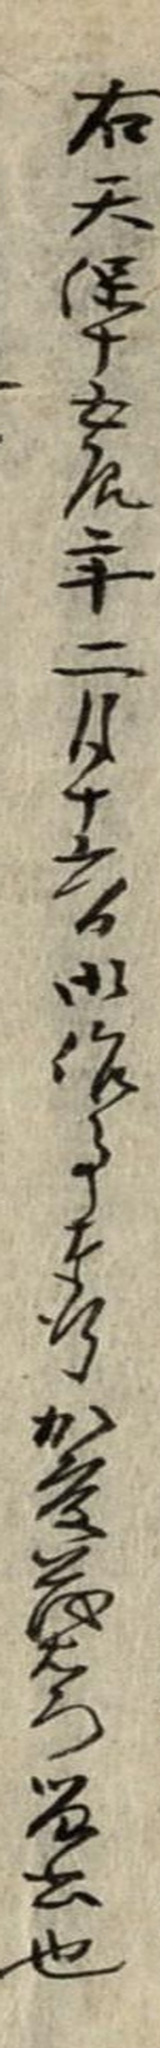右天保十五辰年二月十六日御作事奉行加藤茂右衛門留書也
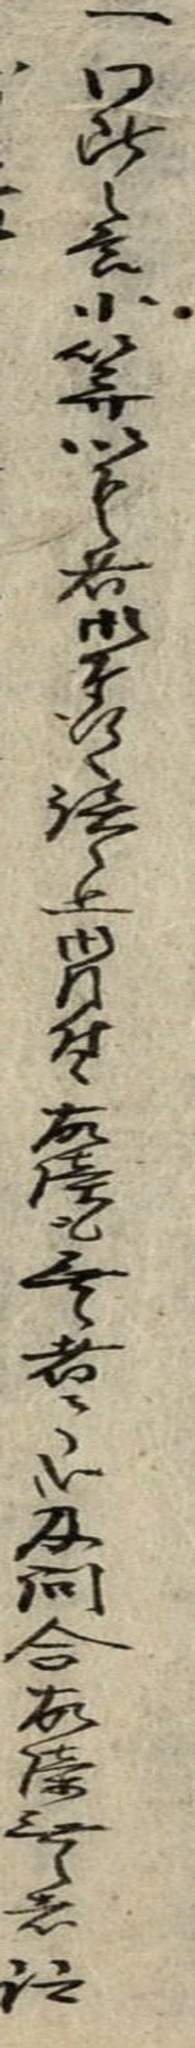一同断之節小算以下之者御奉行へ談之上御目付へ故障も無之者に候哉及問合故障無之者跡
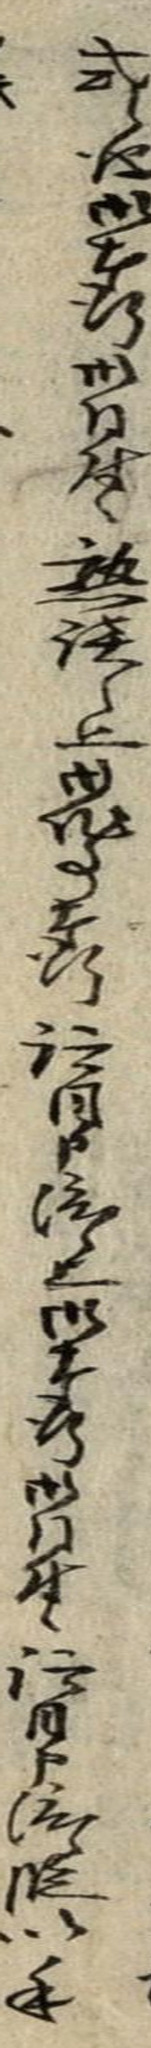式之儀御奉行御目付へ熟談之上御作事奉行跡目申渡候上御奉行御目付へ跡目申渡候段以手
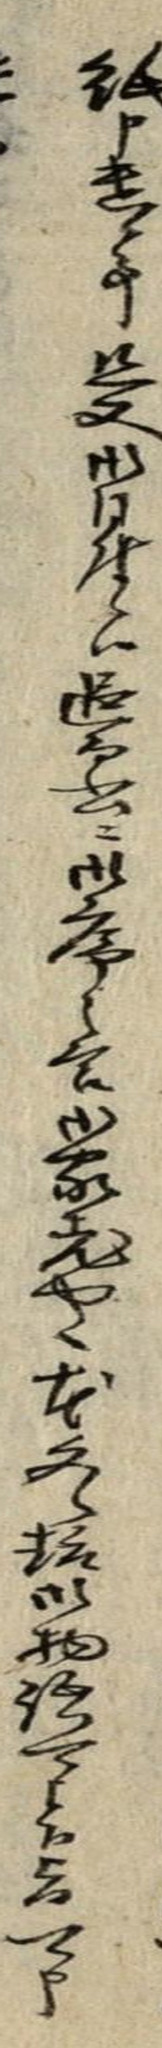紙申遣候事且又御目付へは追而書に御序之節御家老中へ本文之趣御物語可被下旨可申
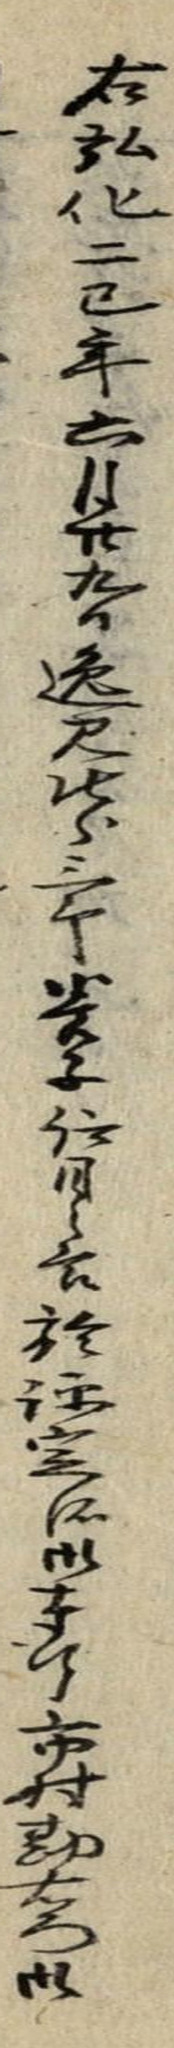右弘化二巳年六月廿九日逸見次郎三郎養子跡目之節於評定所御奉行市村勘右衛門御
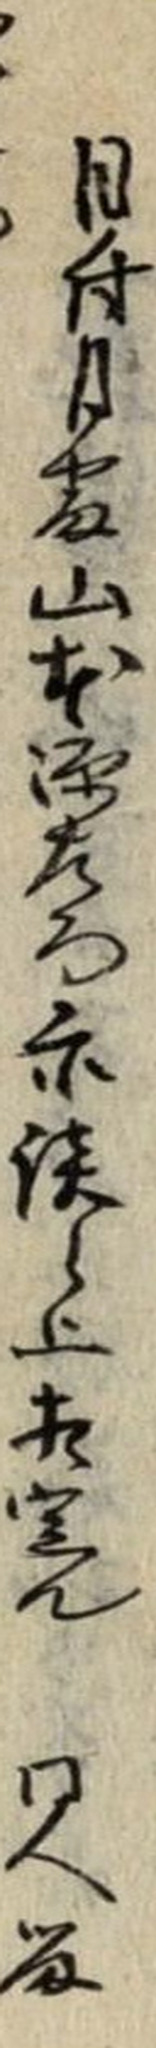目付月番山本源左衛門示談之上相定ル同人留
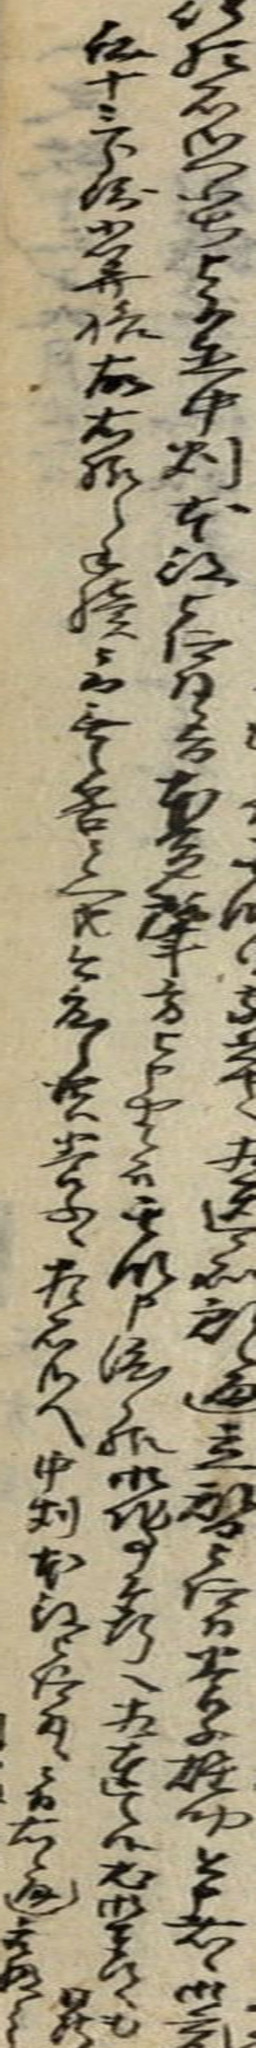但十三郎儀小算格故右様之手続に而無之筈に候へ共今度之儀は養子へ拾石弐人中判本役被仰付候に付右之通取扱之
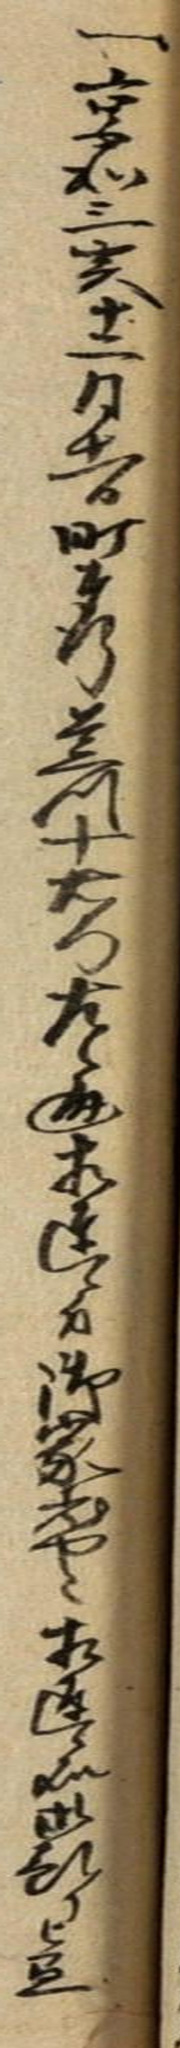一享和三亥十二月十一日町奉行荒川十右衛門左之通相達候に付御家老中へ相達候処御預り被置
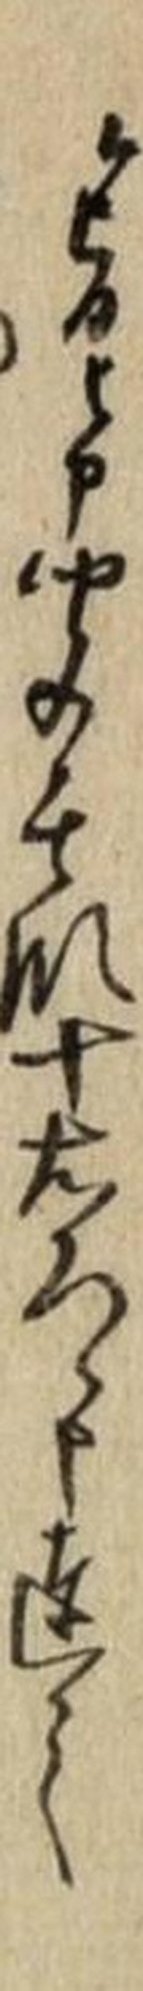候旨被申聞其段十右衛門へ申達之
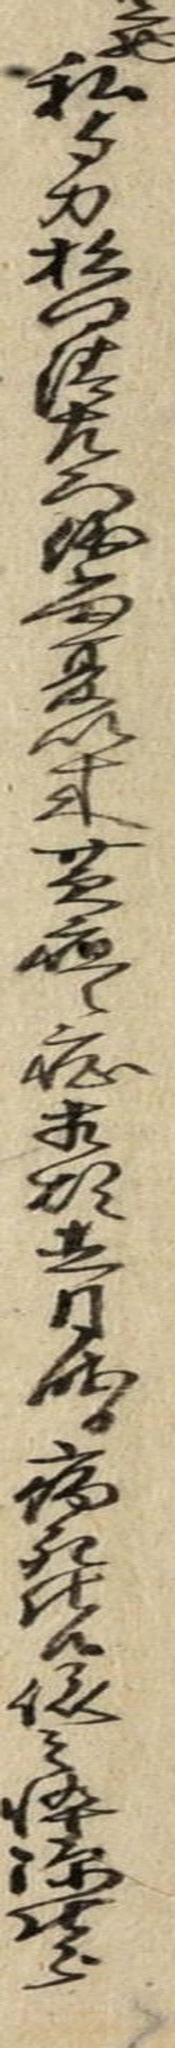私与力松田清左衛門儀当夏以来黄疸之症相煩去月晦日病死仕候依之忰源次郎
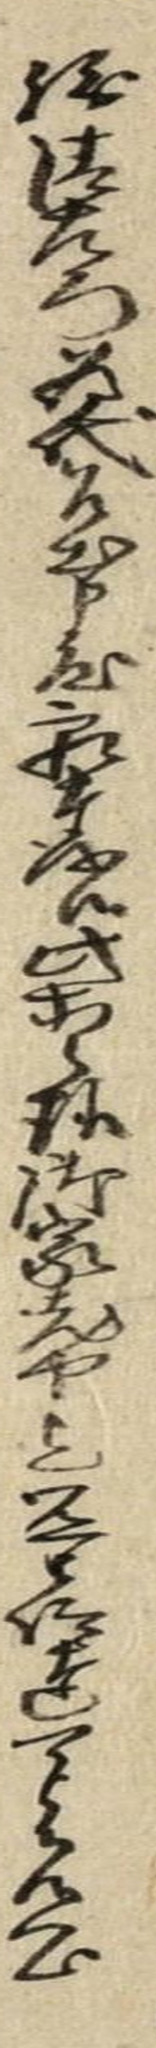儀清左衛門為代召出申度願奉存侯此等之趣御家老中迄宜被仰達可被下候以上
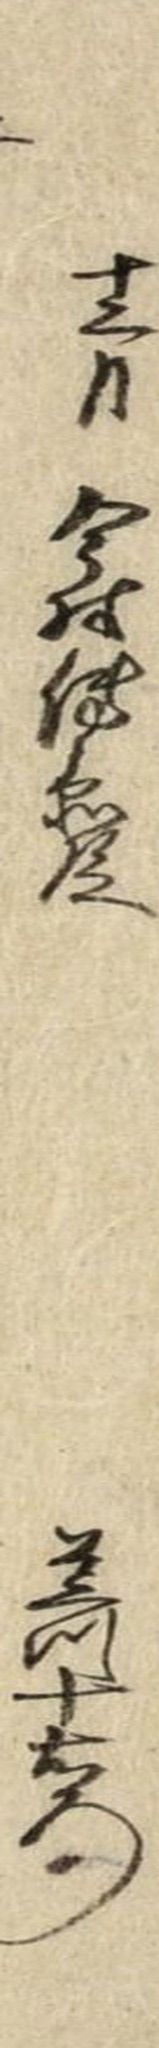十二月今村伝兵衛殿荒川十右衛門
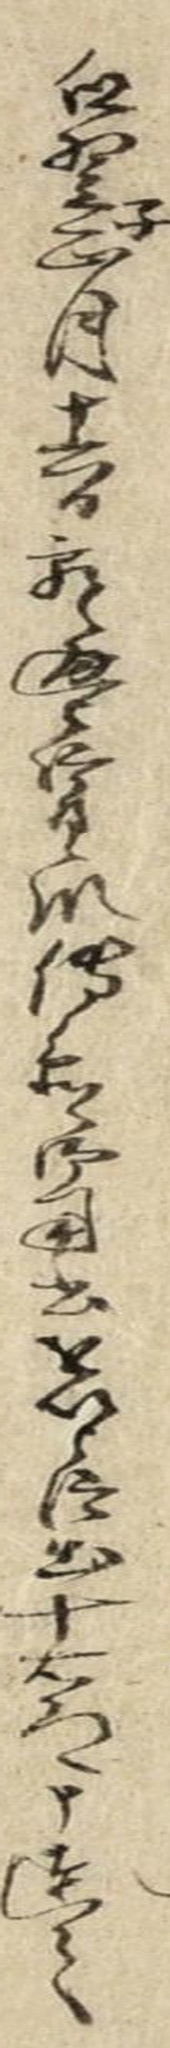但翌子正月十六日願之通被仰付候段伝兵衛へ御用書を以被仰出十右衛門へ申達之
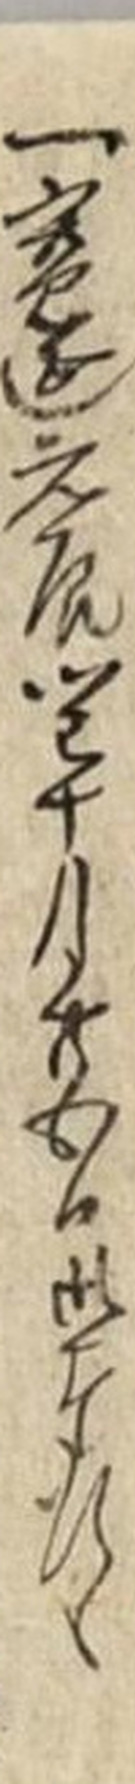一寛延元辰閏十月廿五日御奉行へ
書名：御用并被仰出之部
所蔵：福井県文書館 Fukui Prefectural Archives
